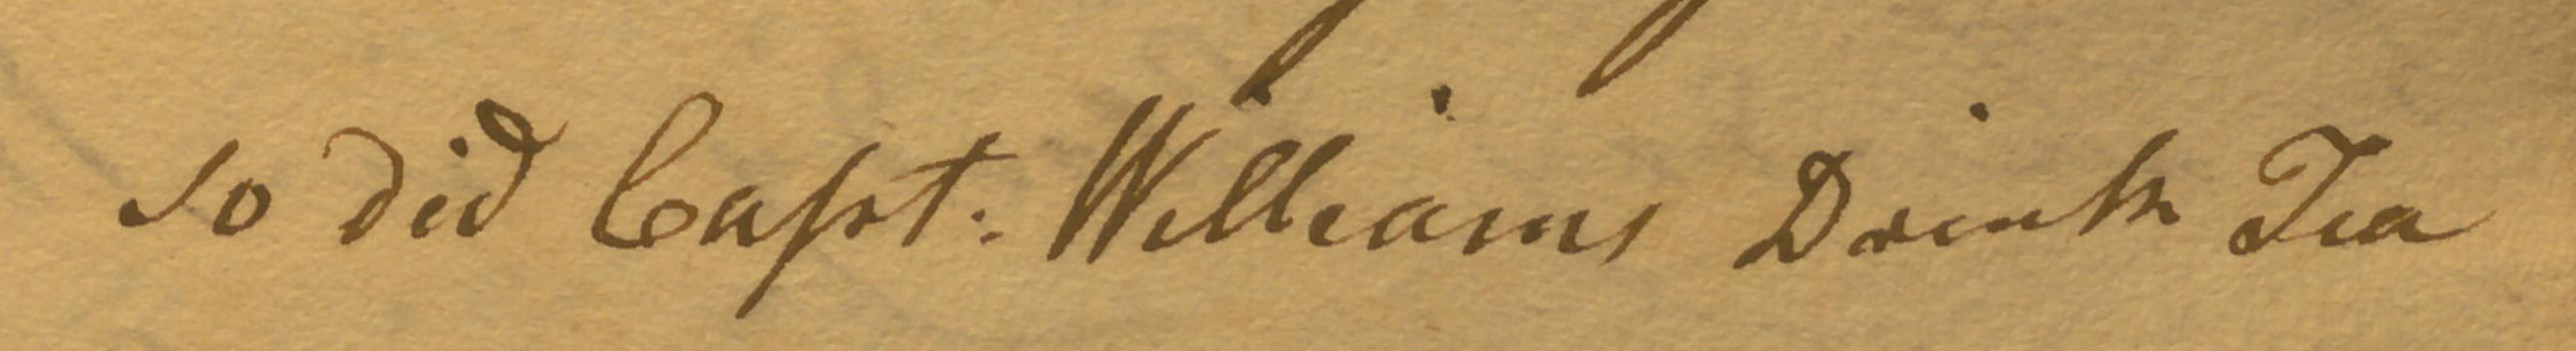so did Capt. Williams Drink Tea
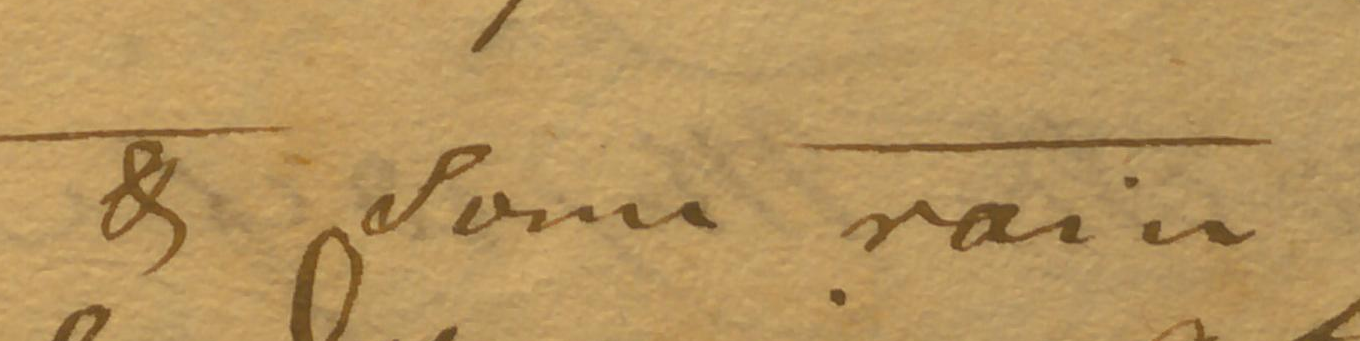& some rain
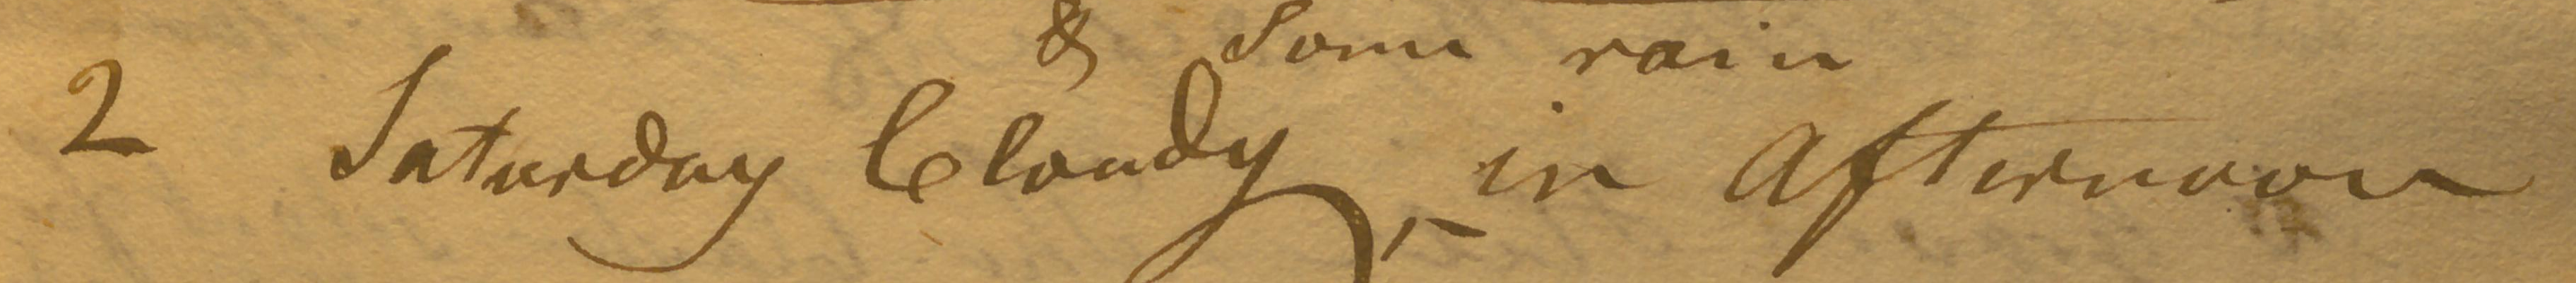2 Saturday Cloudy ^ in Afternoon
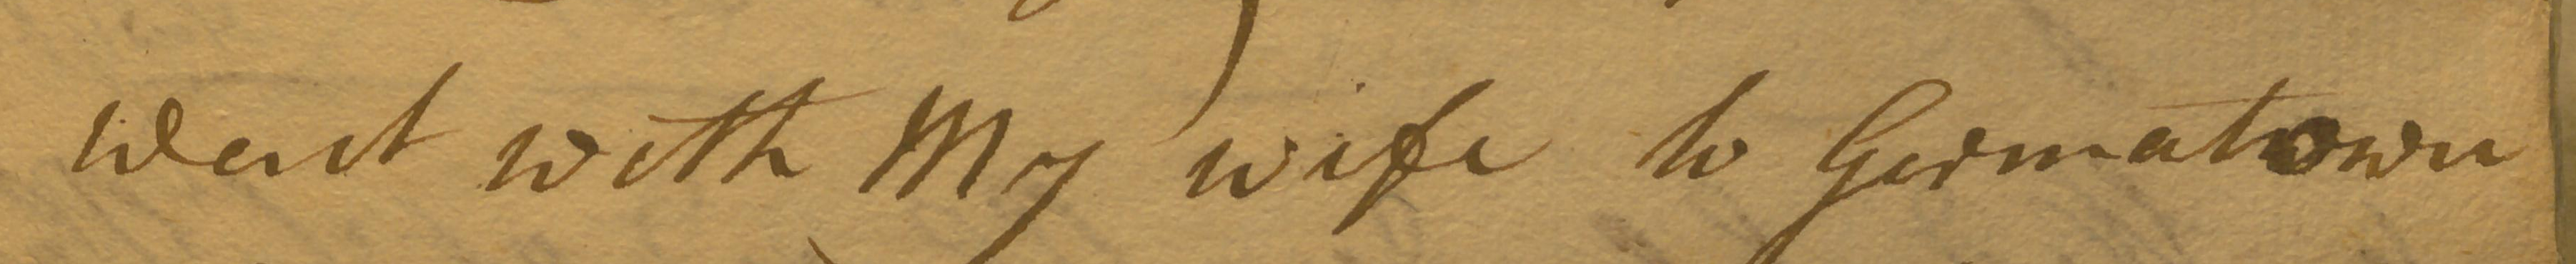went with My wife to Germantown
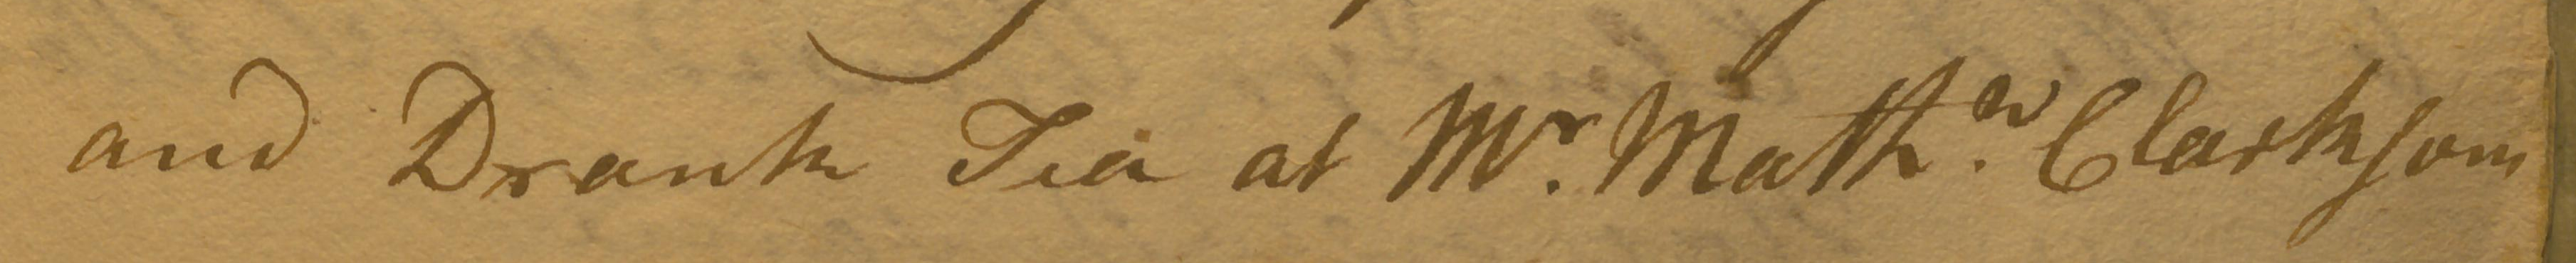aned Drank Tea at M^r. Math^w. Clarksons
